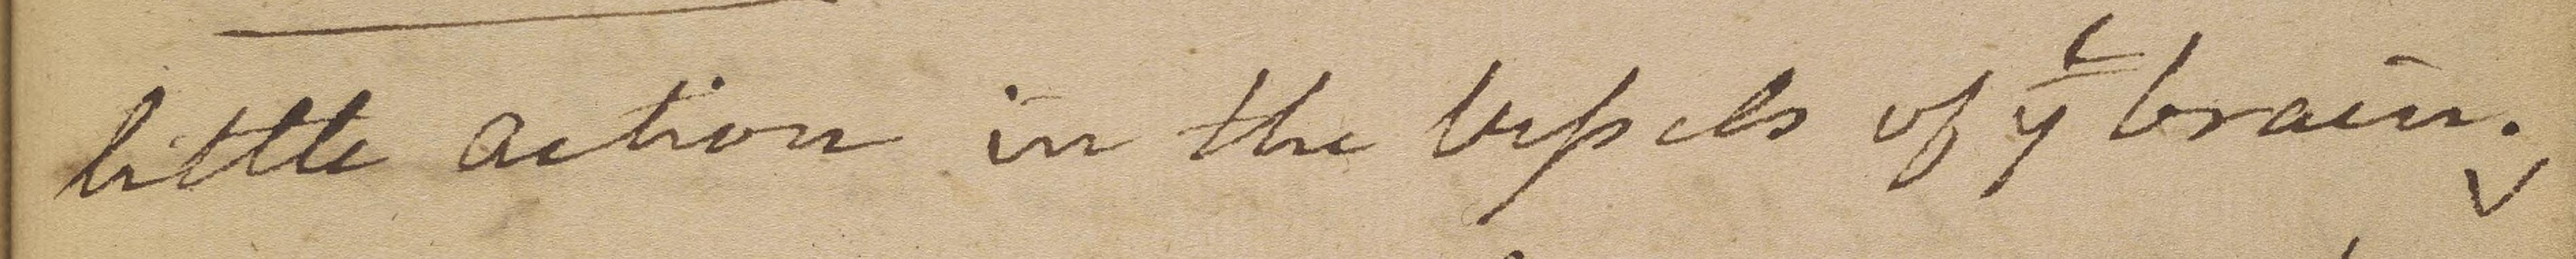little action in the vessels of y^e brain.
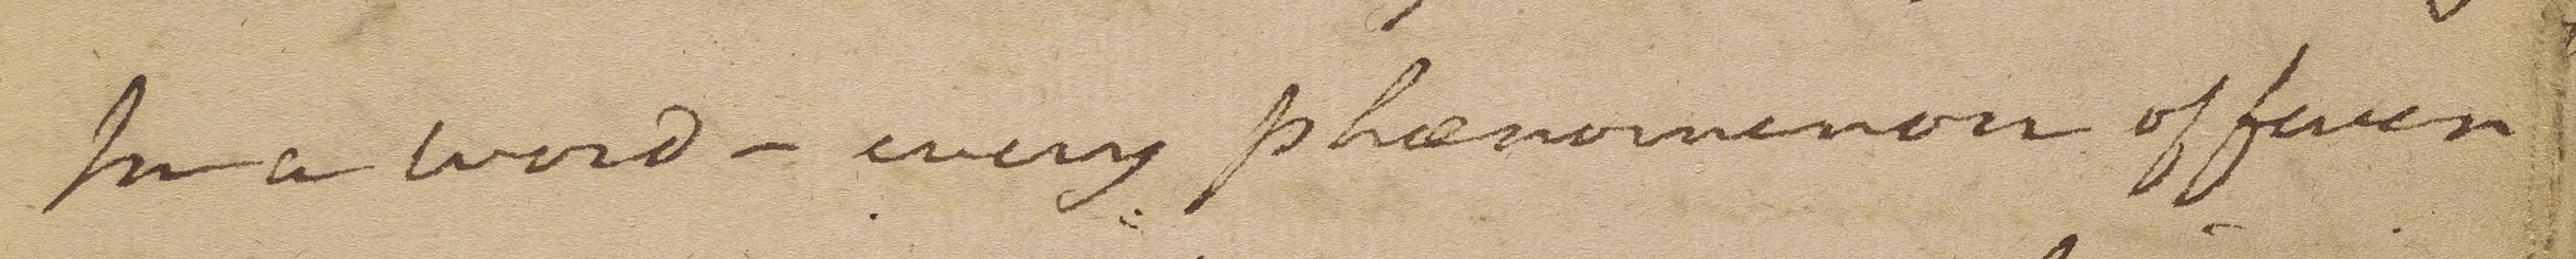In a word, every phenomenon of fever
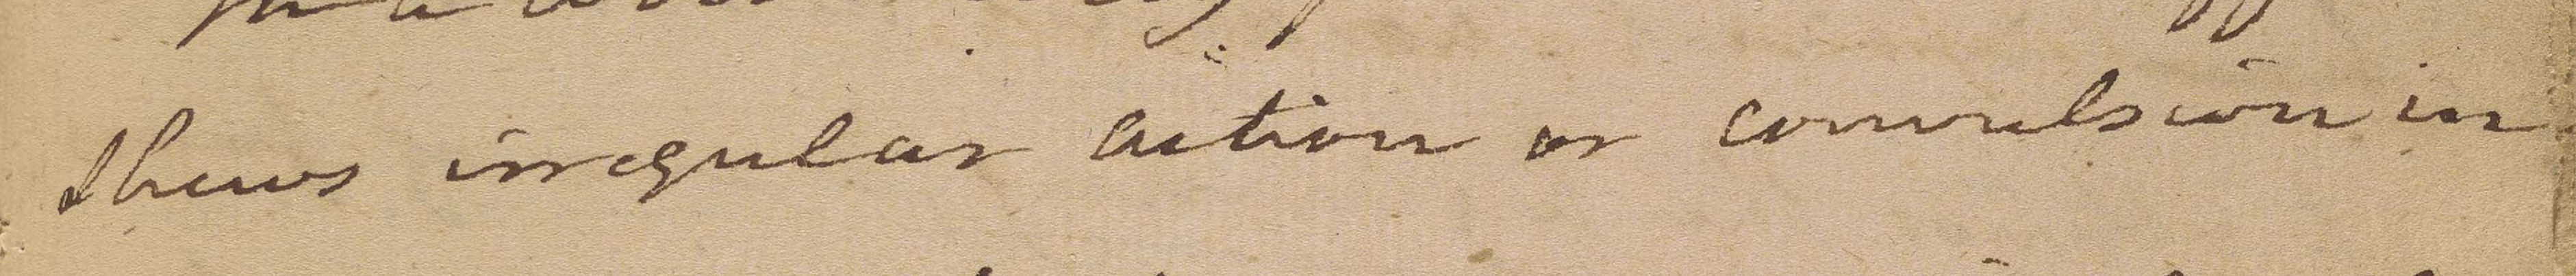shews irregular action or convulsion in
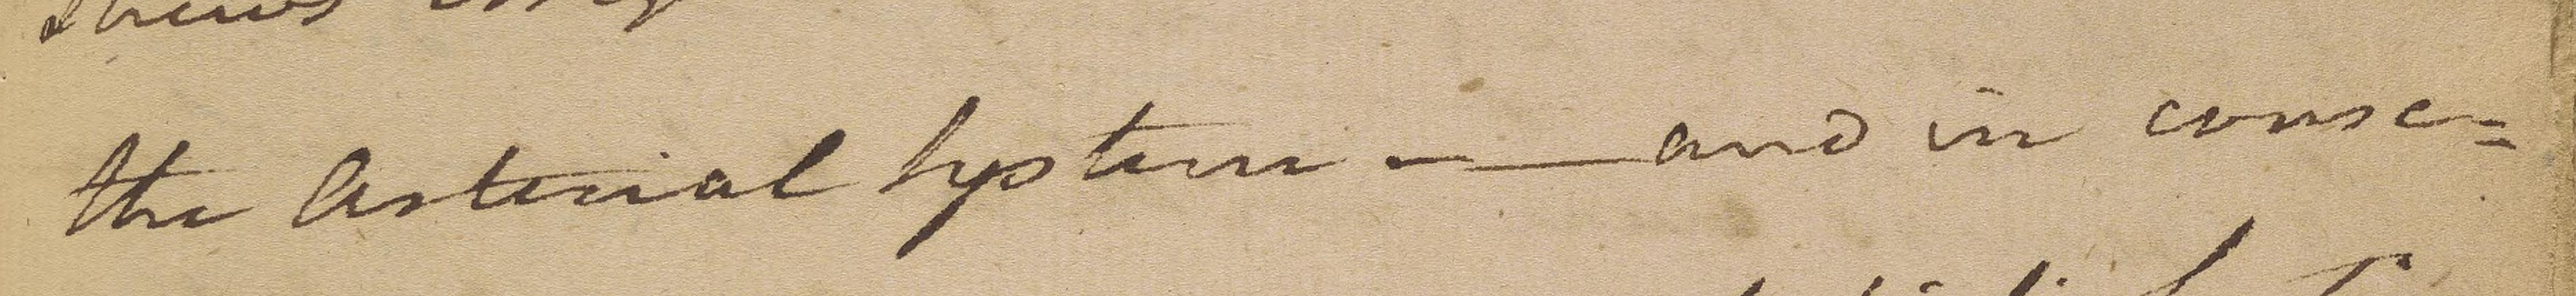the arterial system, and in conse-
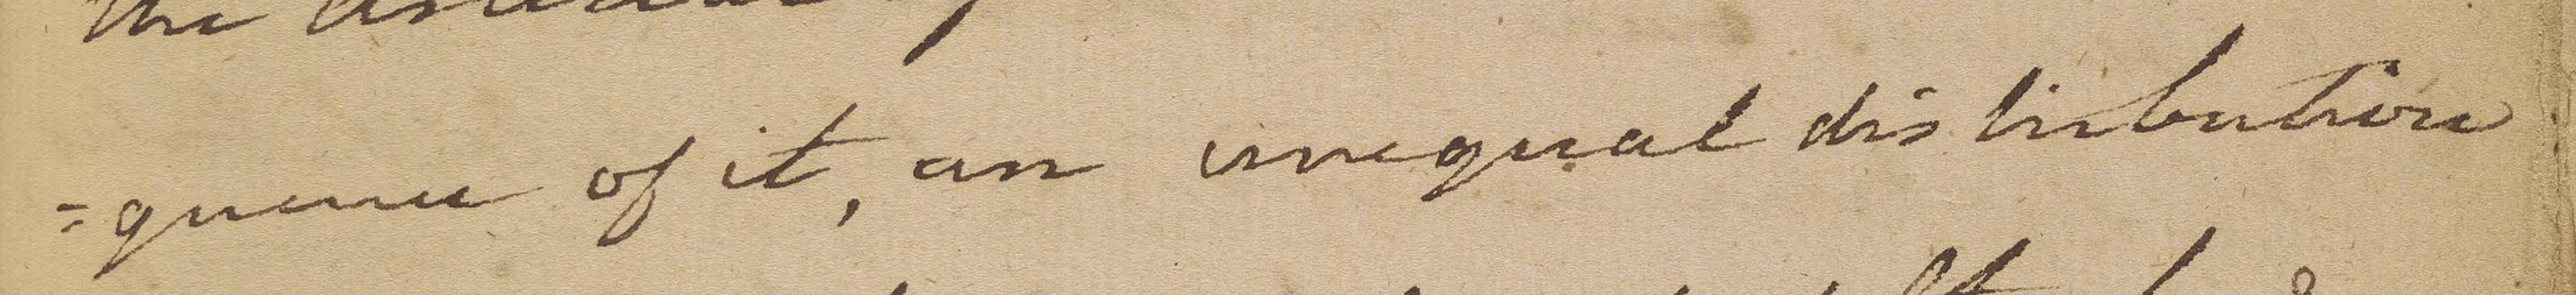-quence of it, an unequal distribution
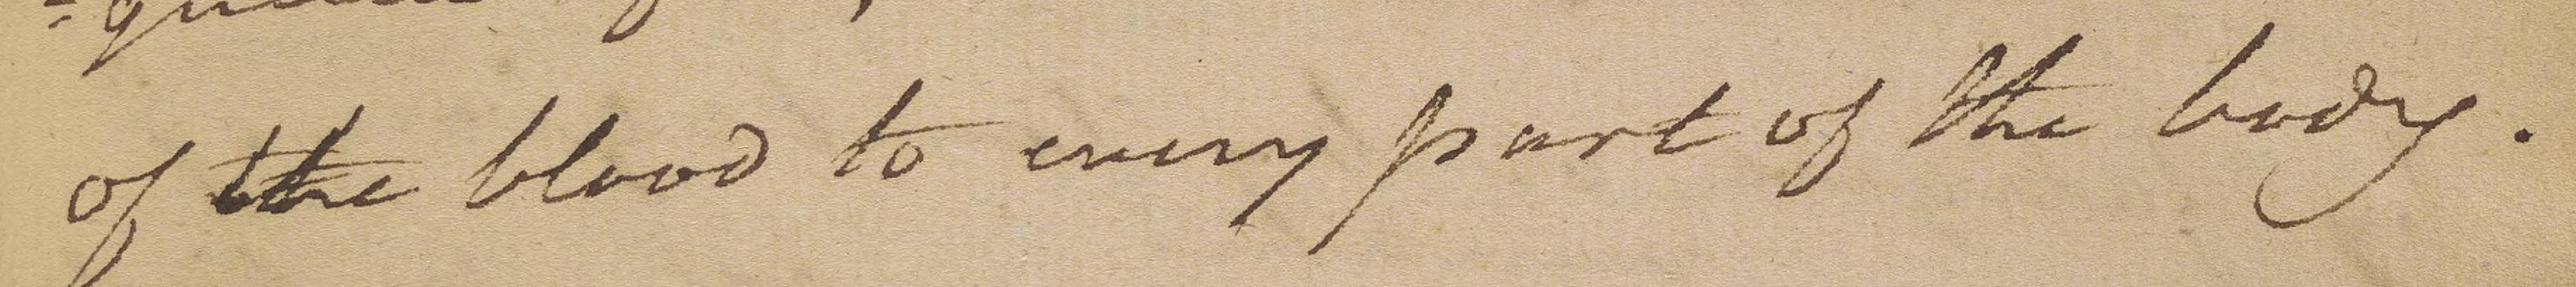of the blood to every part of the body.
